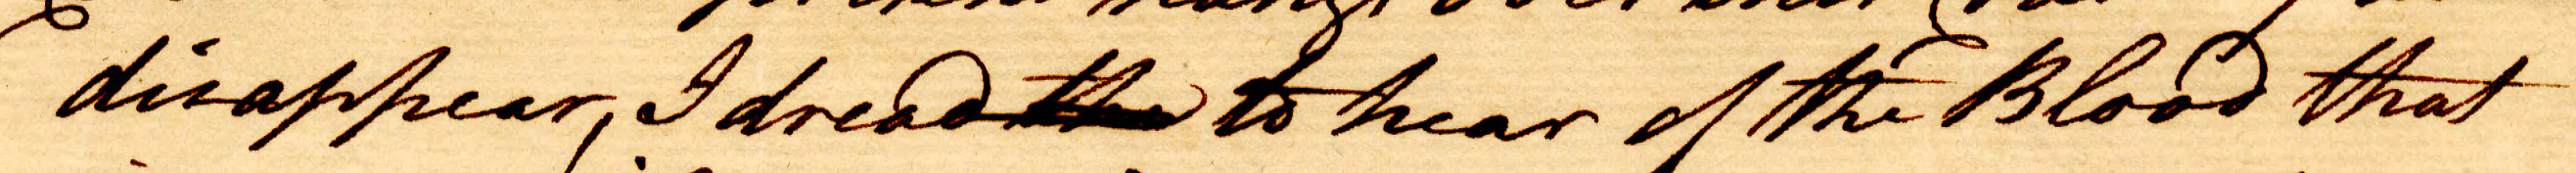disappear, I dread to hear of the Blood that
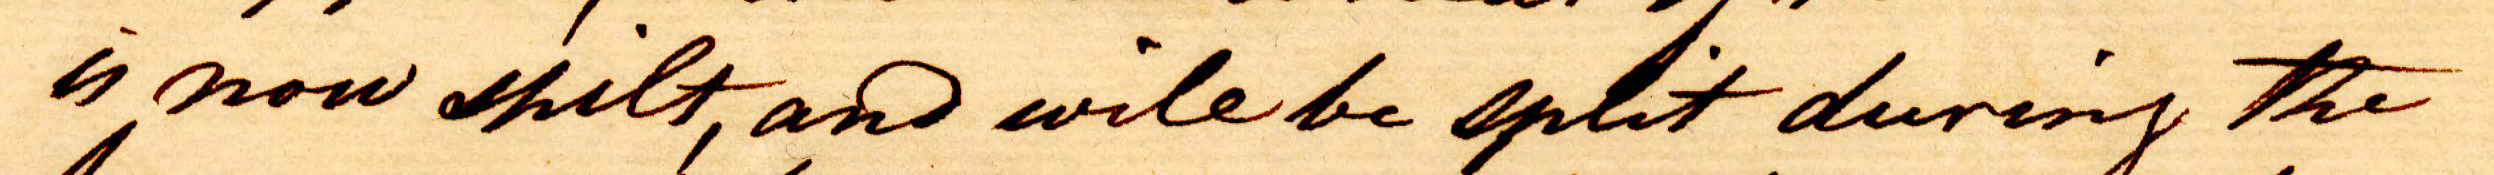is now spilt and will be spilt during the
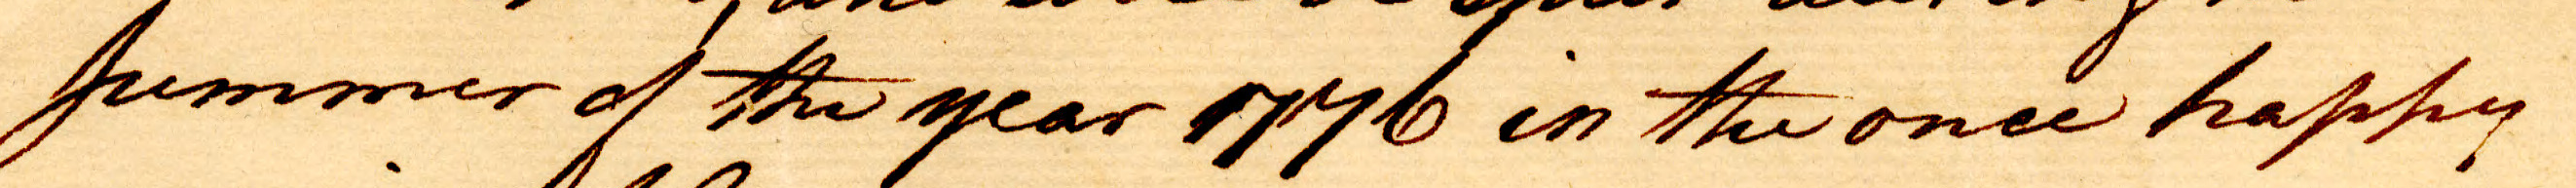summer of the year 1776 in the once happy
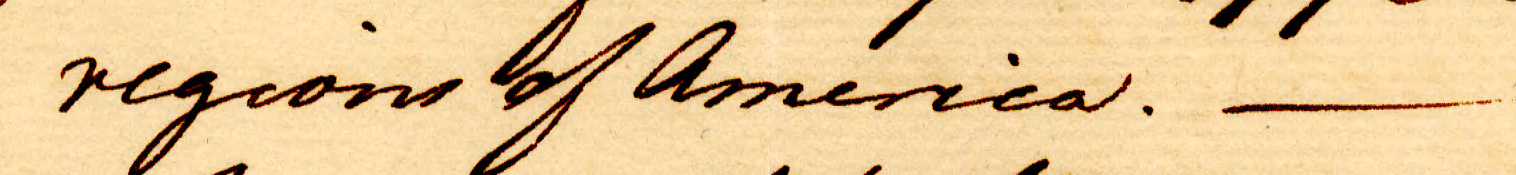regions of America.-
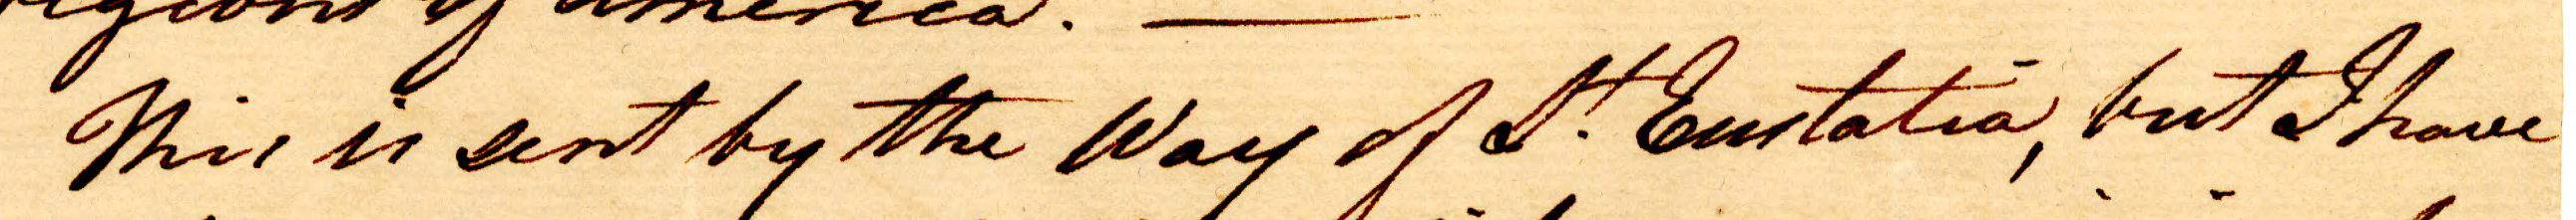This is sent by the Way of S^t. Eustatia, but I have
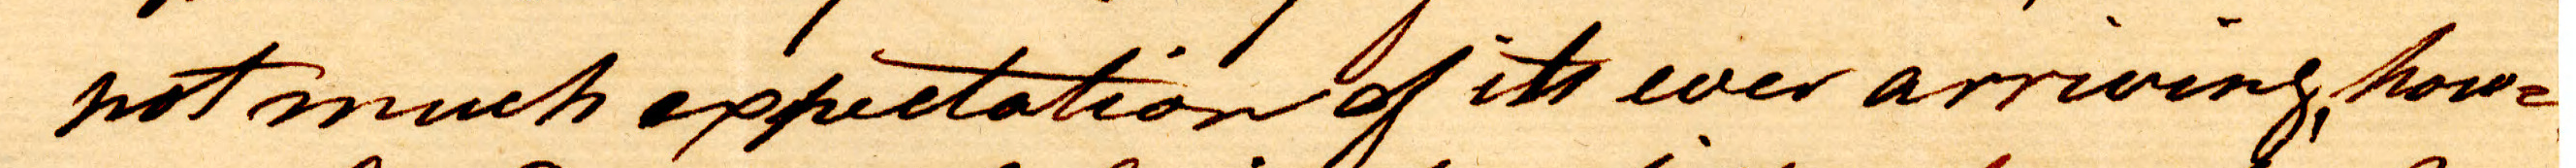not much expectation of it ever arriving, how-
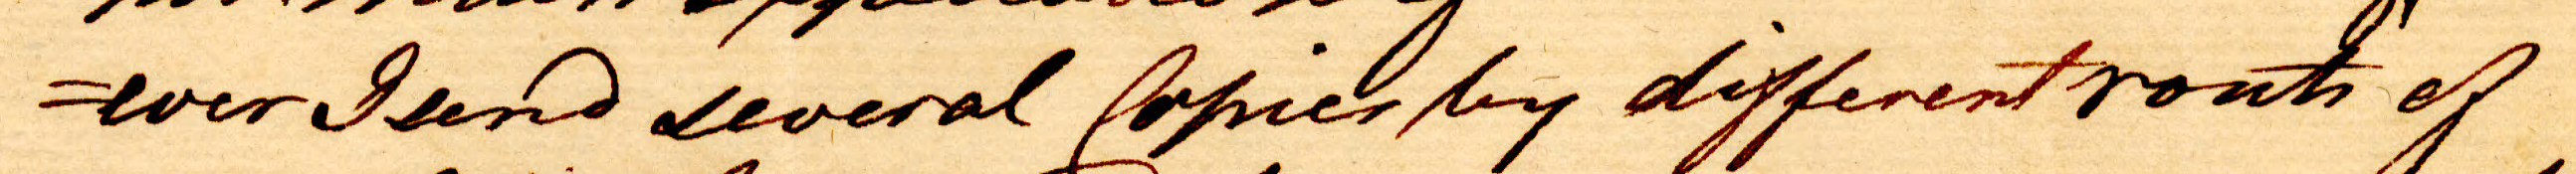-ever I send several Copies by different routs of
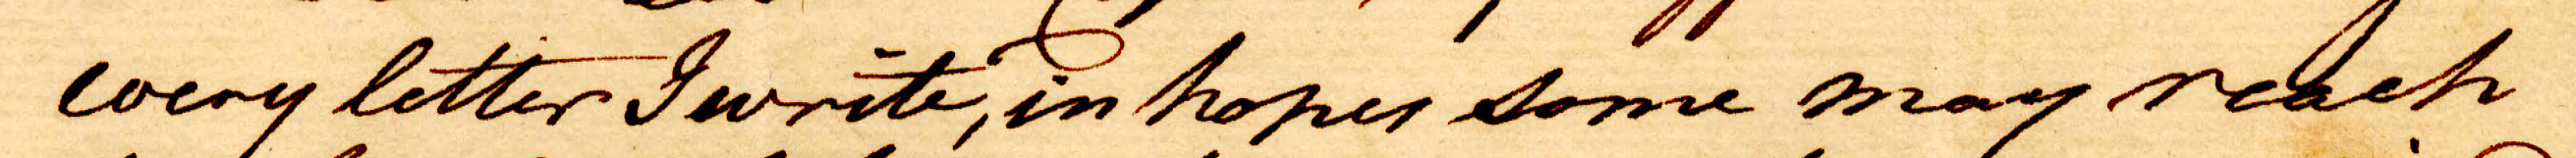every letter I write, in hopes some may reach
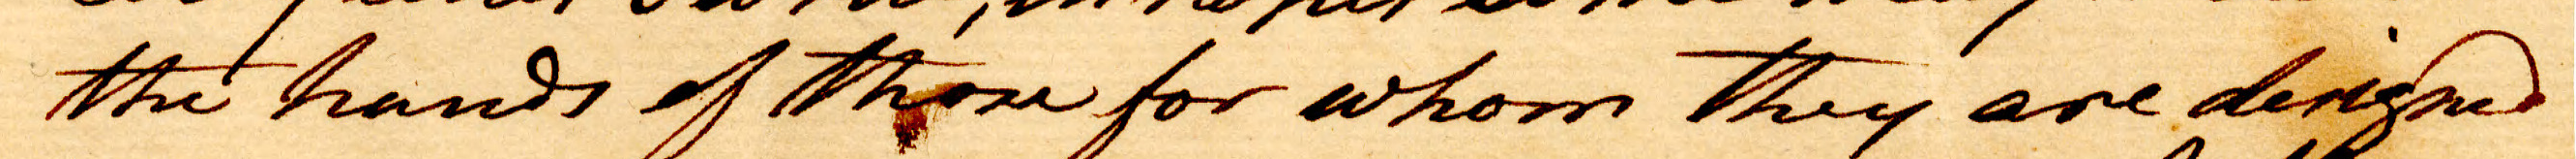the hands of those for whom they are designed
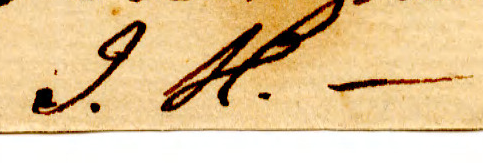J. H.-
